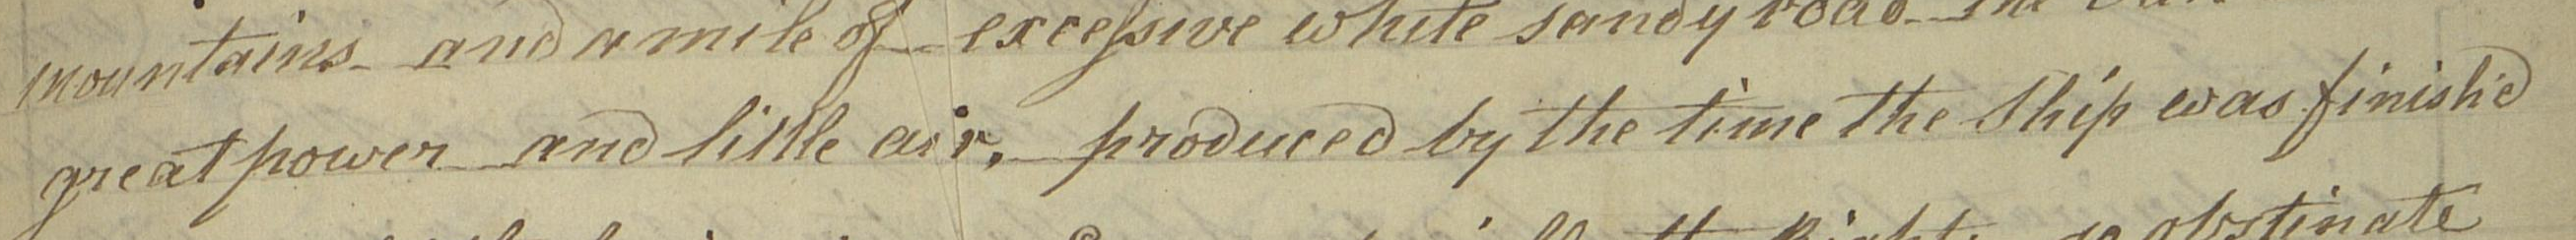great power and little air, produced by the time the Ship was finish'd
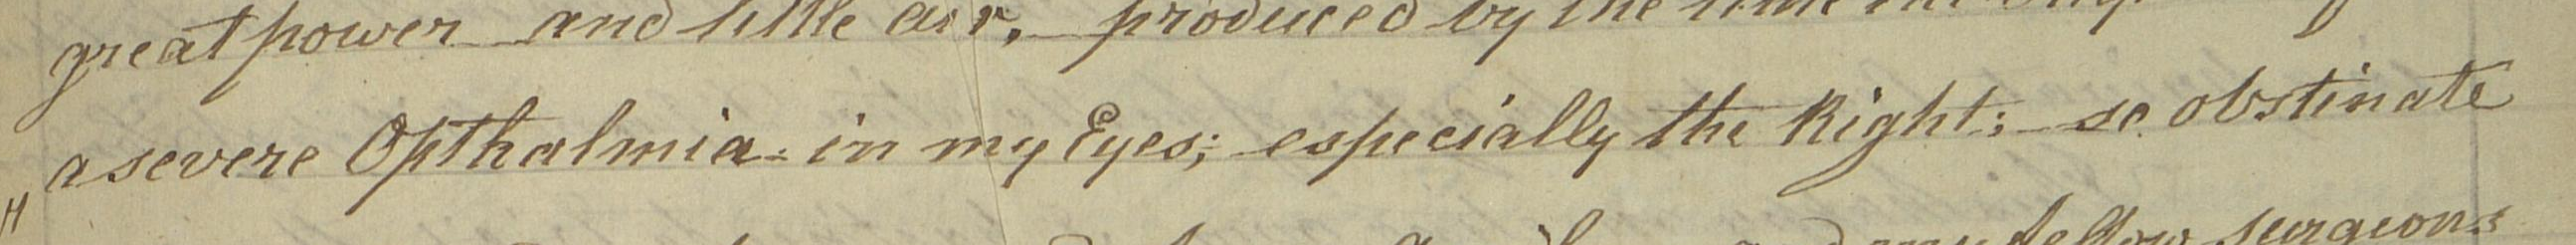a severe Opthalmia in my Eyes; especially the Right; so obstinate
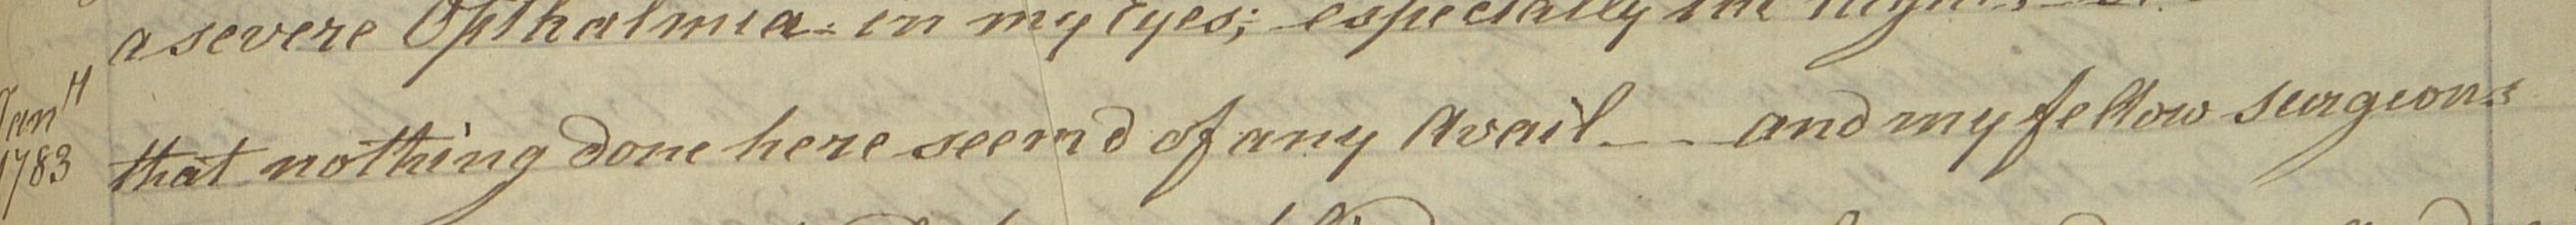that nothing done here seemd of any avail, and my fellow surgeons
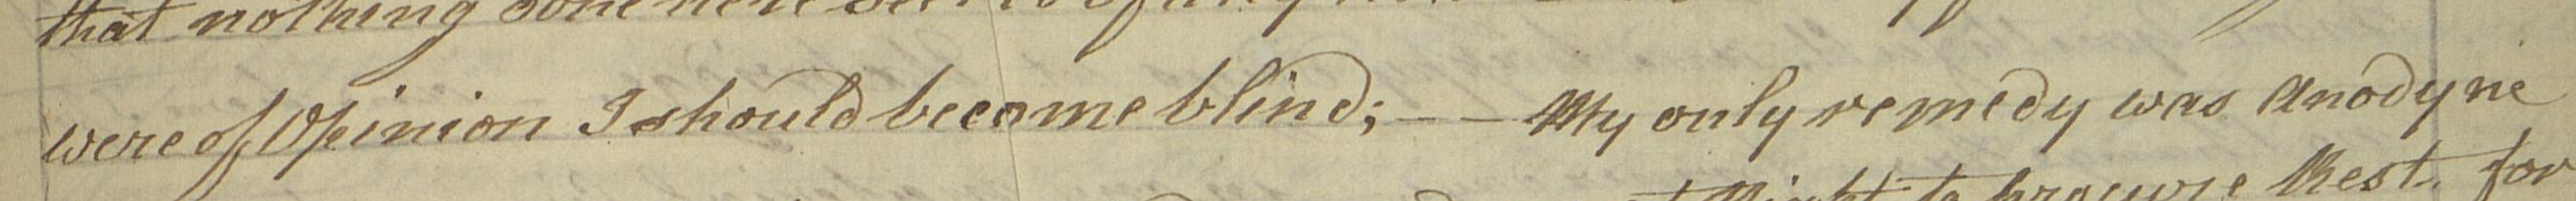were of Opinion I should become blind; My only remedy was anodyne
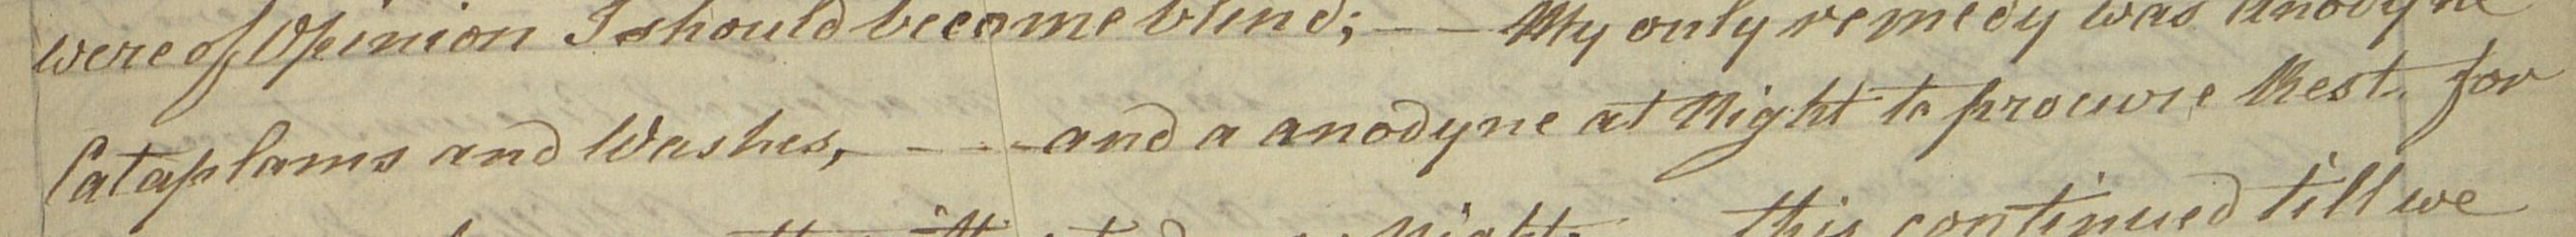Cataplams and Washes, and a anodyne at night to procure Rest for
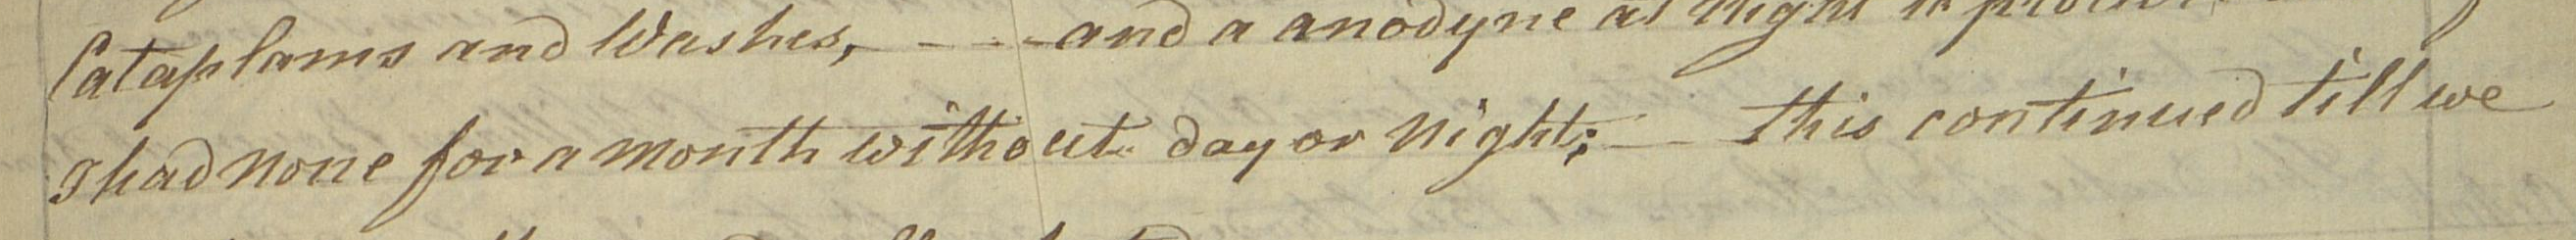I had none for a month without day or night; this continued till we
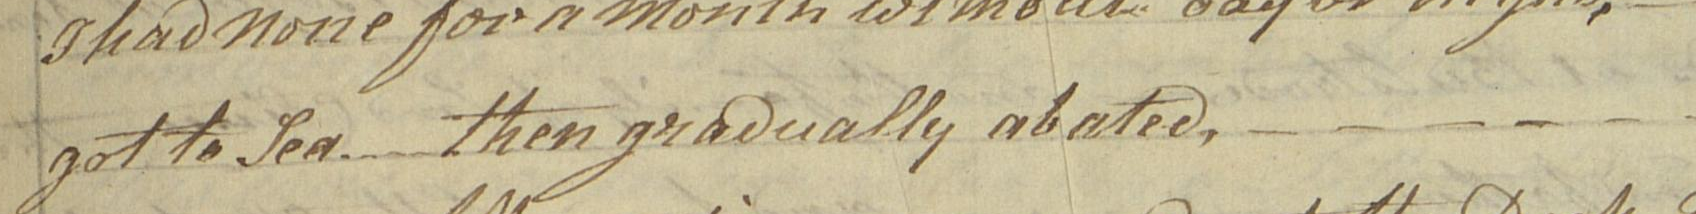got to Sea, then gradually abated,
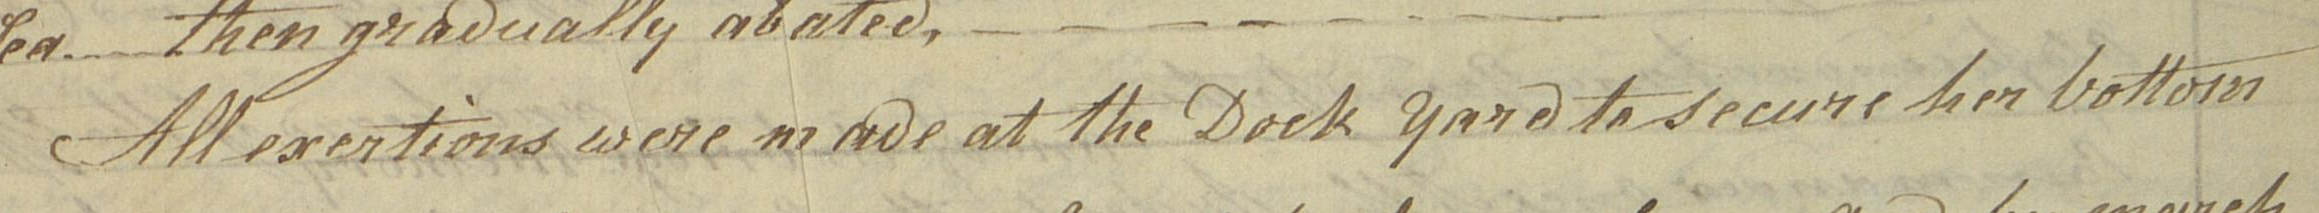All exertions were made at the Dock yard to secure her bottom
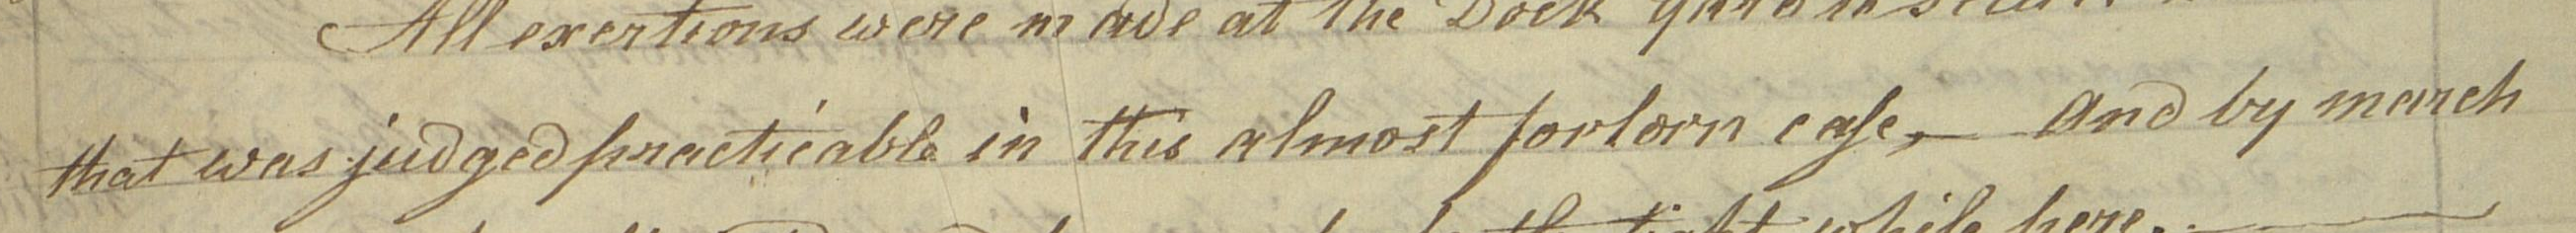that was judged practicable in this almost forlorn case, And by march
